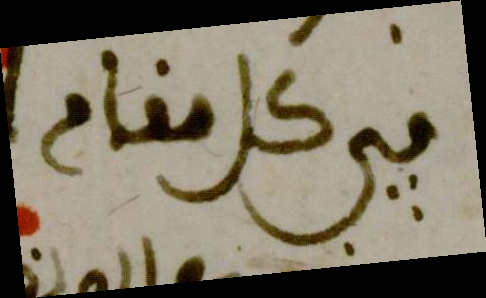في كل مقام
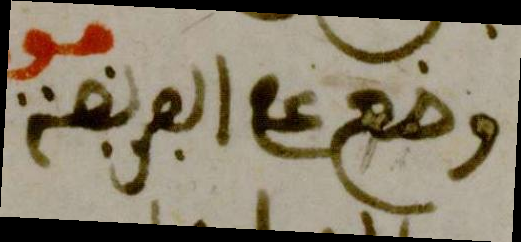وضع على الفريضة
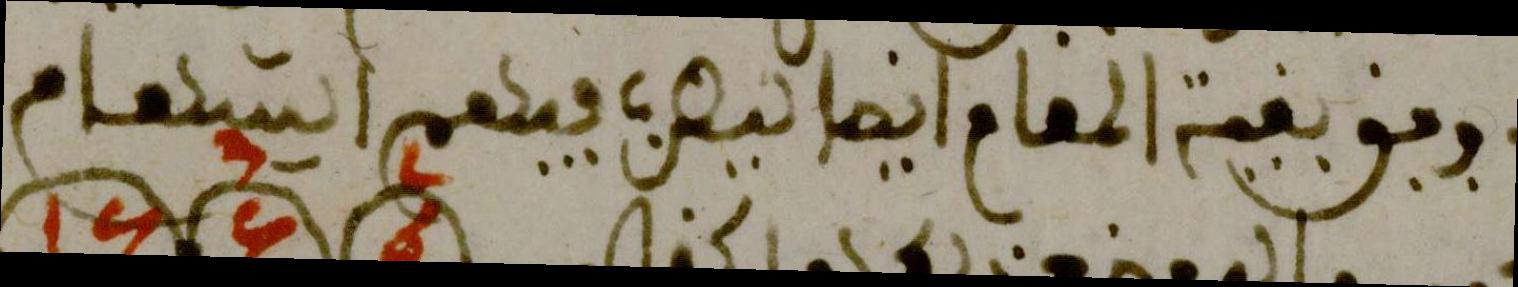ومن بقية المقام أيضا ليضرب فيهم السهام
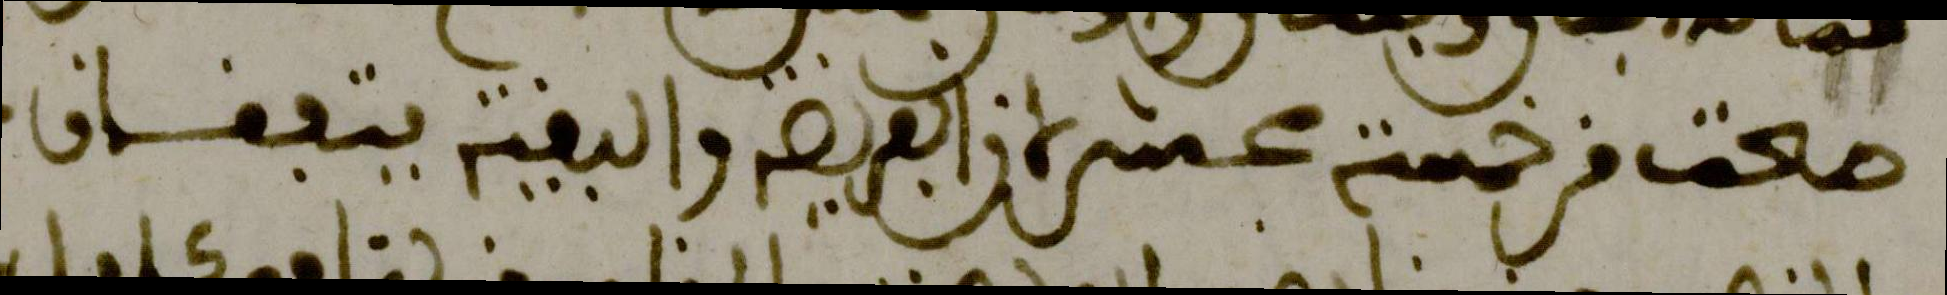صحت من خمسة عشر لان الفريضة والبقية يتفقان
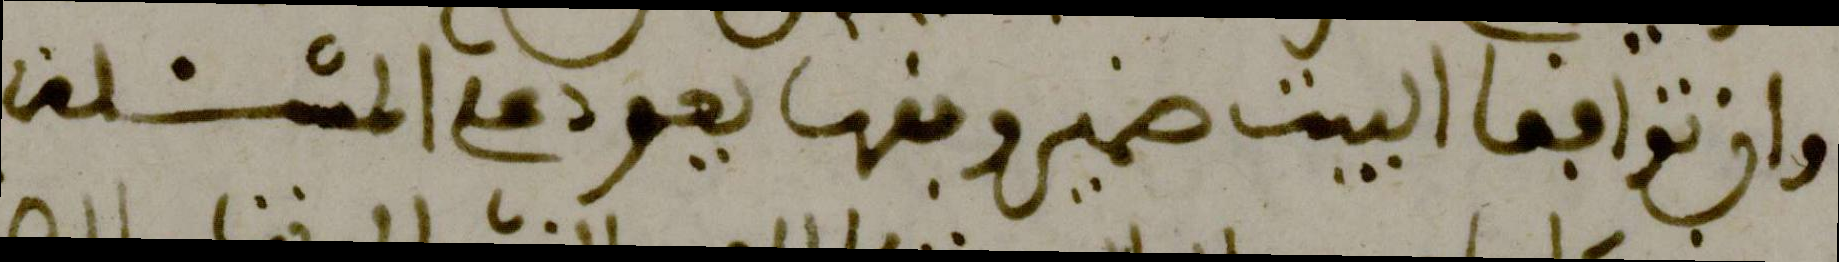وان توافقا البيت ضمير وفقها يعود على المسئلة
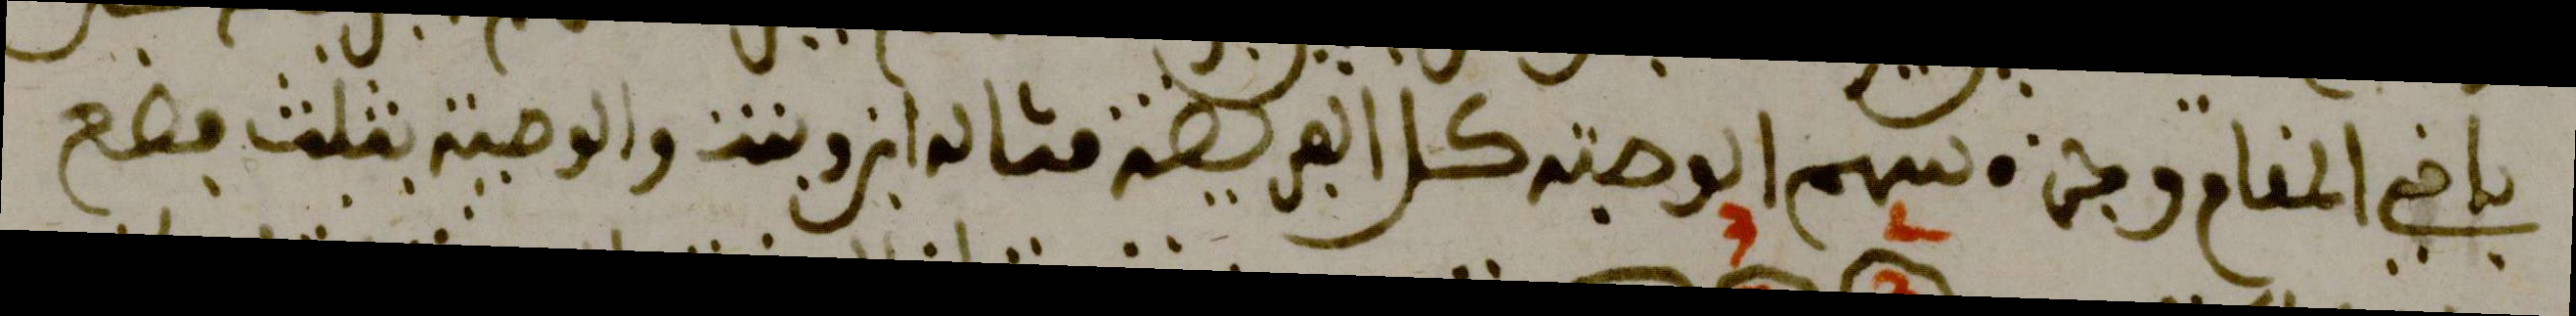باقي المقام وجزء سهم الوصته كل الفريضة مثاله ابن وبنت والوصيته بثلث فضع
